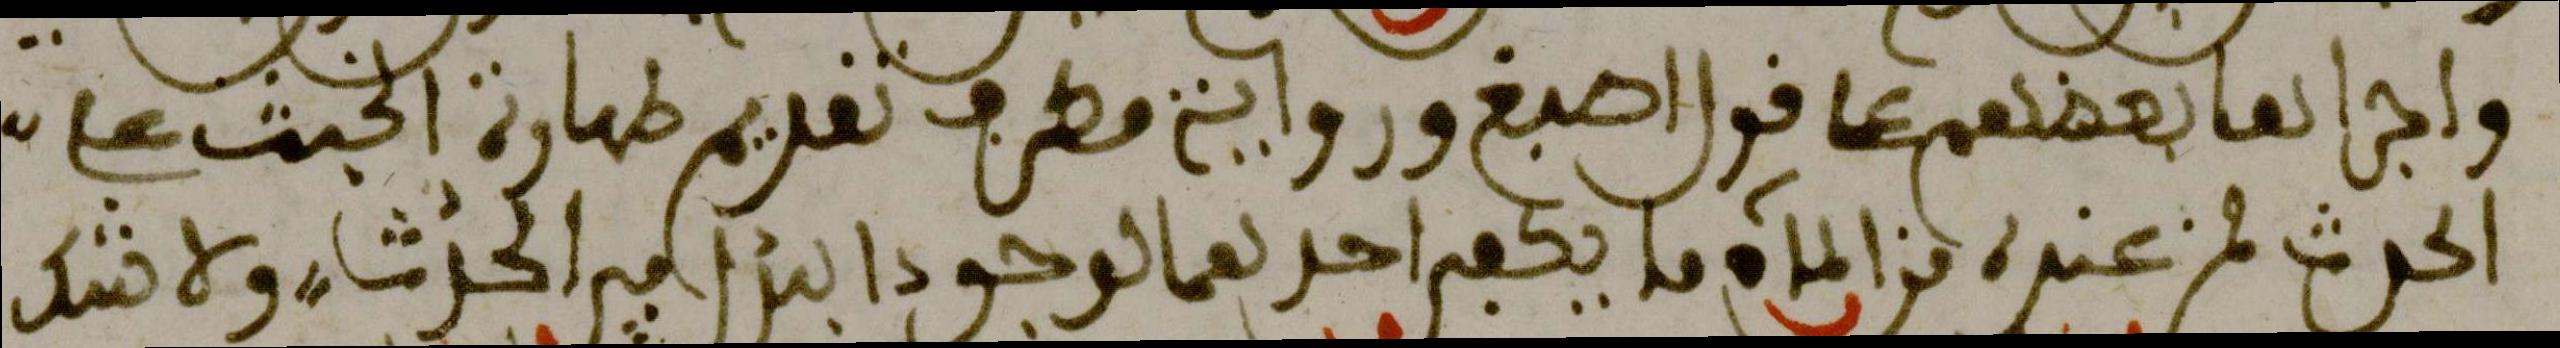واجراها بعضهم على قول اصبغ ورواية مطرف تقديم طهارة الخبث على
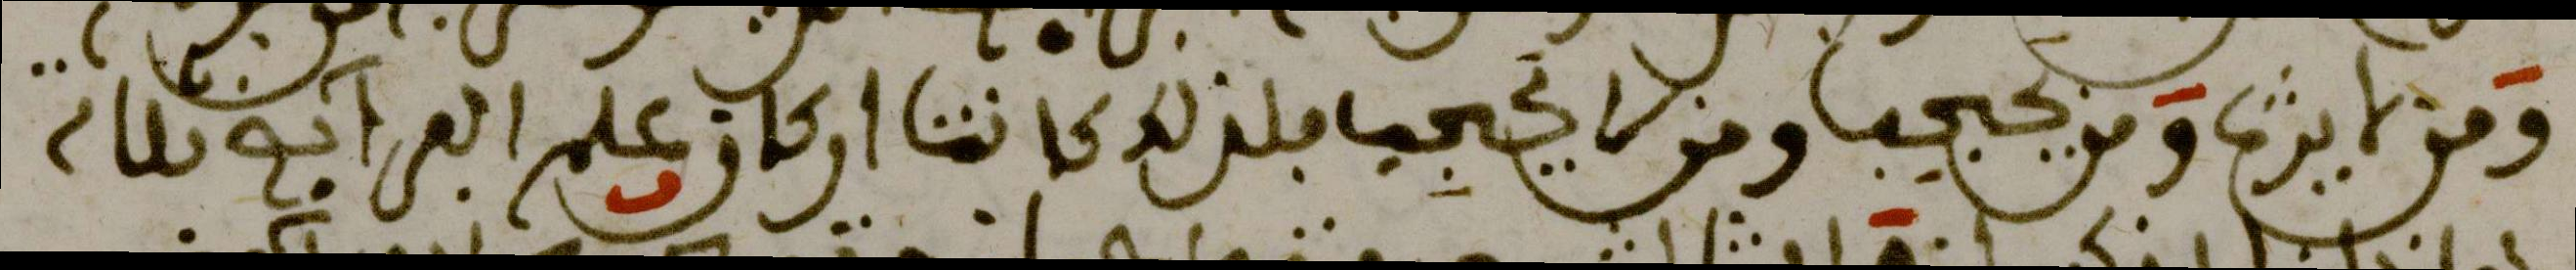وَمن لا يرث وَمن يحجب ومن لا يَحجِب فلذلك كانت ار كان علم الفرائض ثلاثة
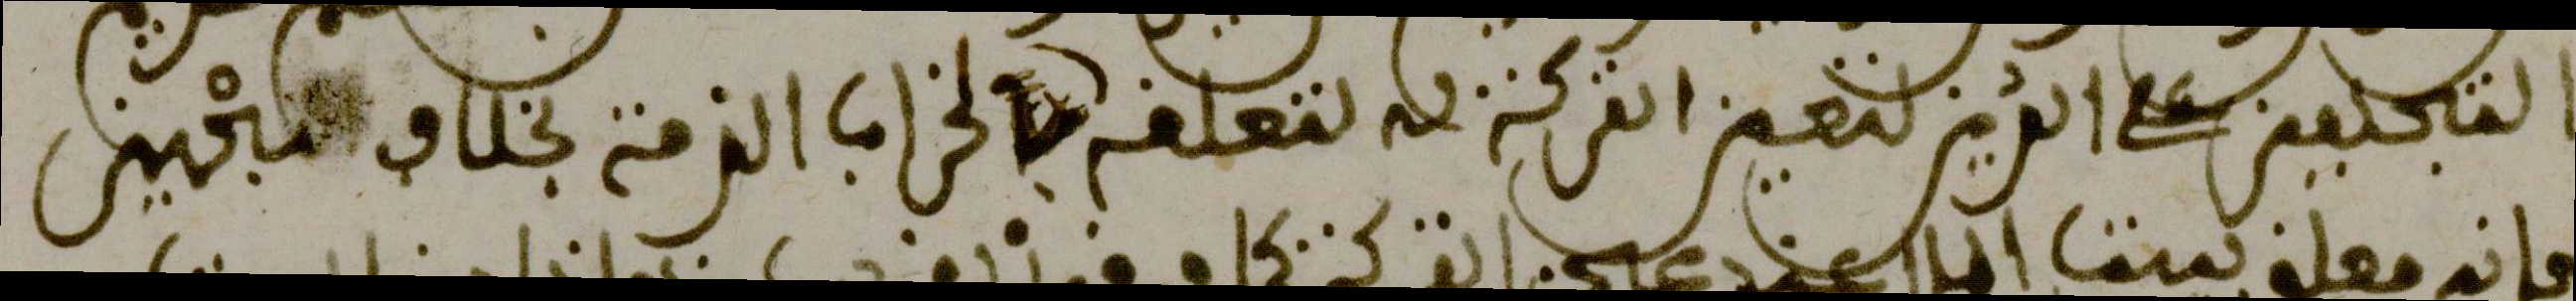التجهيز على الدين لتعين التركة له لتعلقه # الخراب الذمة بخلاف التجْهيز
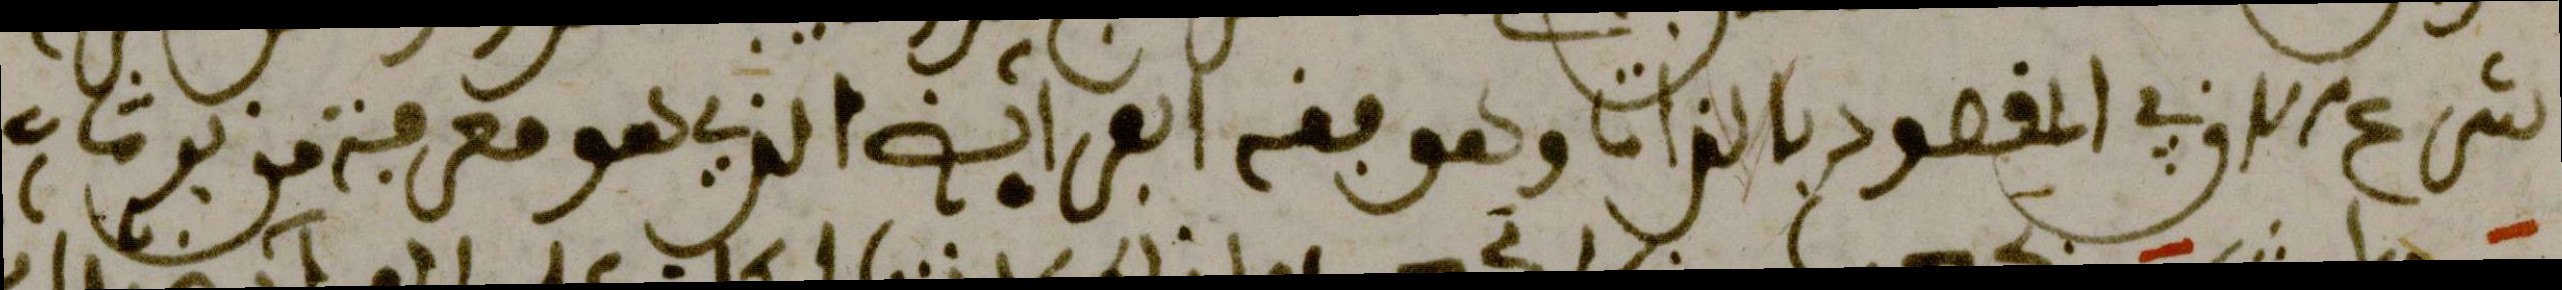شرع الان في المقصود بالذات وهو فقه الفرائض الذي هو معرة من يرث
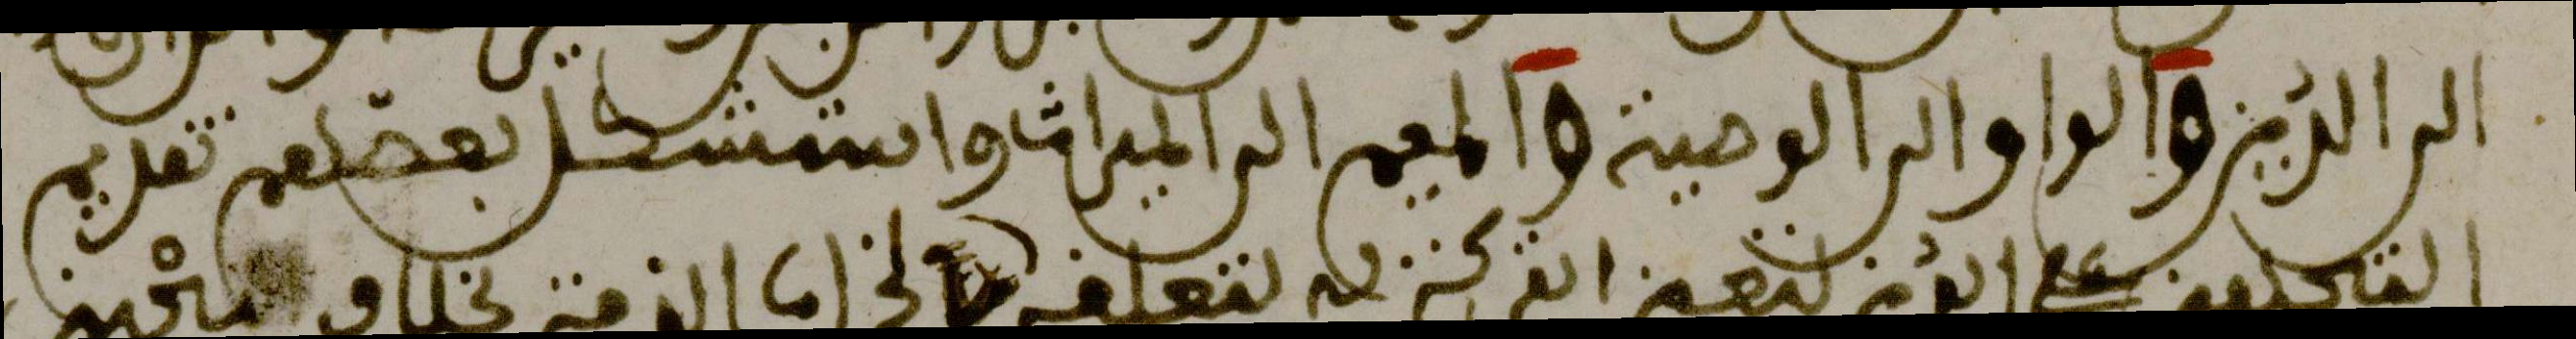الى الدين وَالواو الى الوصية وَالميم الى الميراث واستشكل بعضهم تقديم
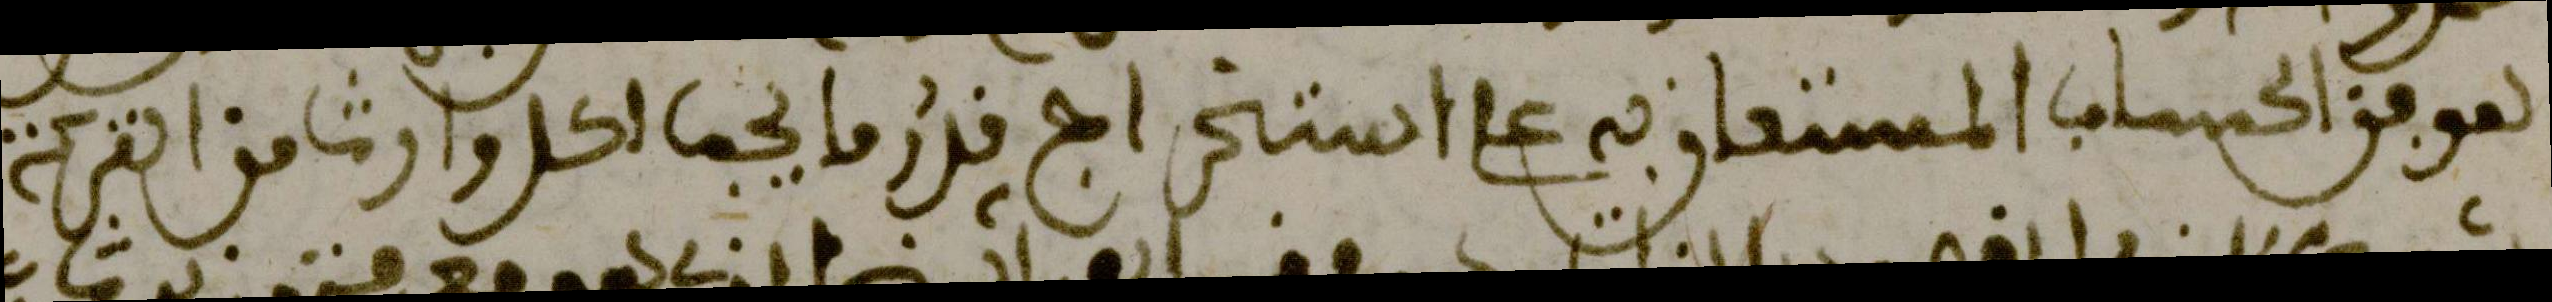هو فن الحساب المستعان به على استخراج قدر ما يجب لكل وارث من التركة
